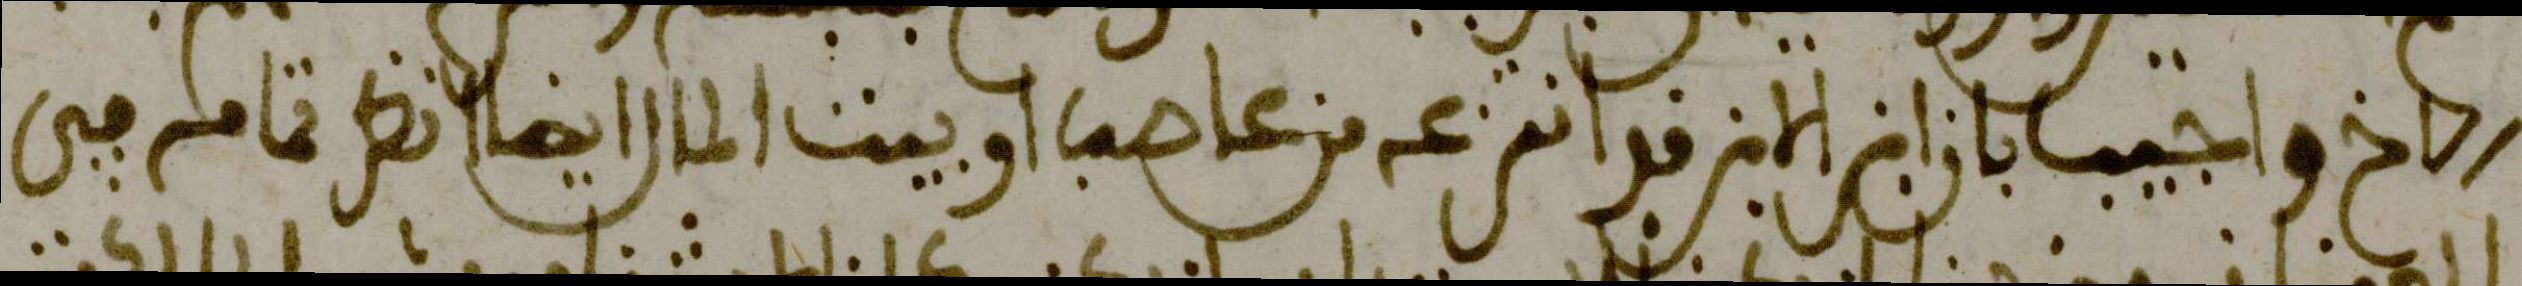الاخ واجيب بان ابن الابن قد انتزعه من عاصب او بيت المال ايضا انظر تمامه في
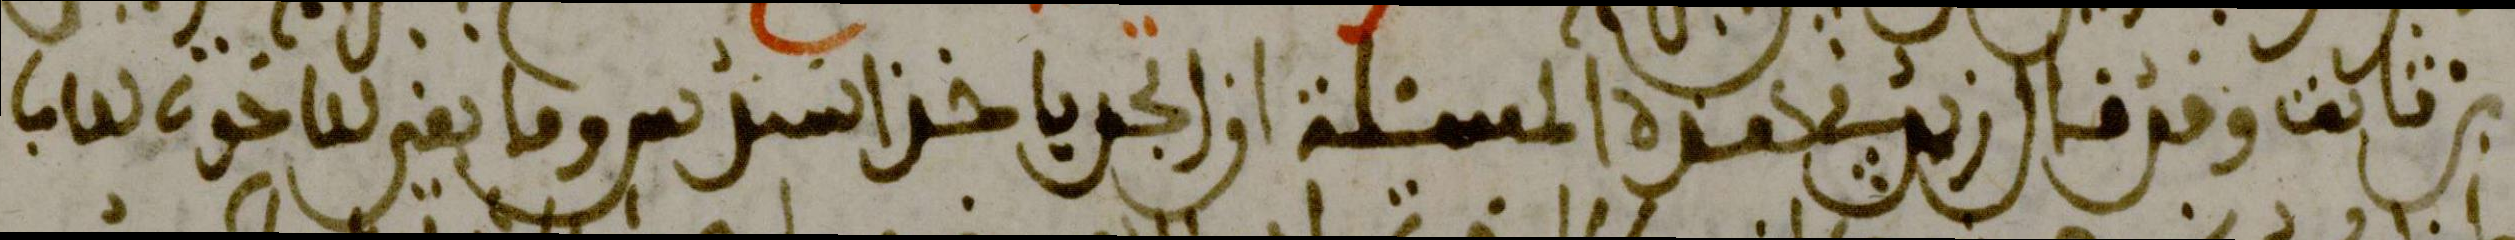بن ثابت وقد قال زيد في هذه المسئلة ان الجد ياخذ السدس وما بقي للاخوة للاب
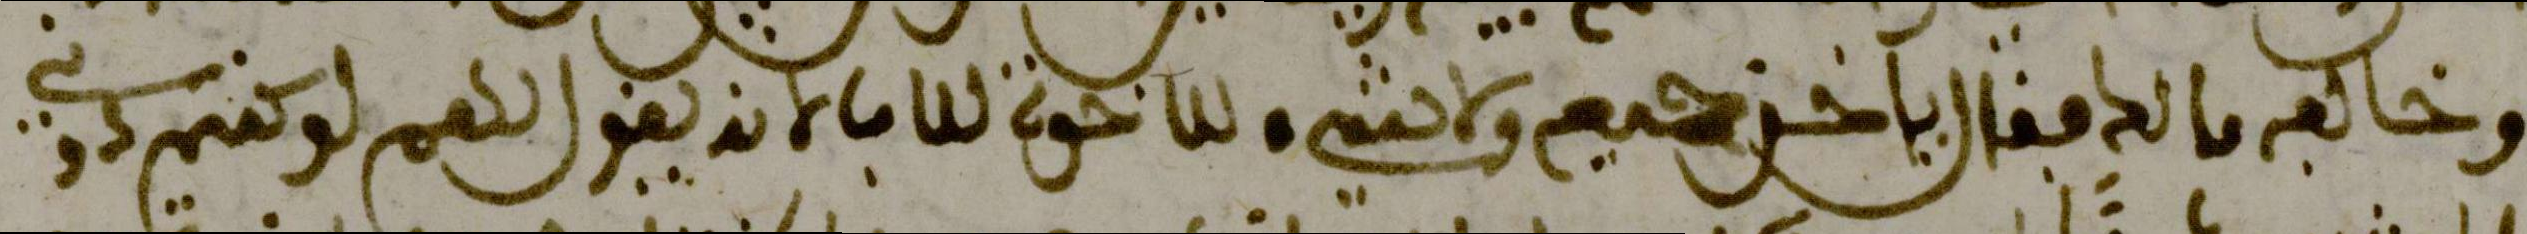وخالفه مالك فقال ياخذ جميعه ولا شيء للاخوة للاب لانه يقول لهم لو كنتم دو
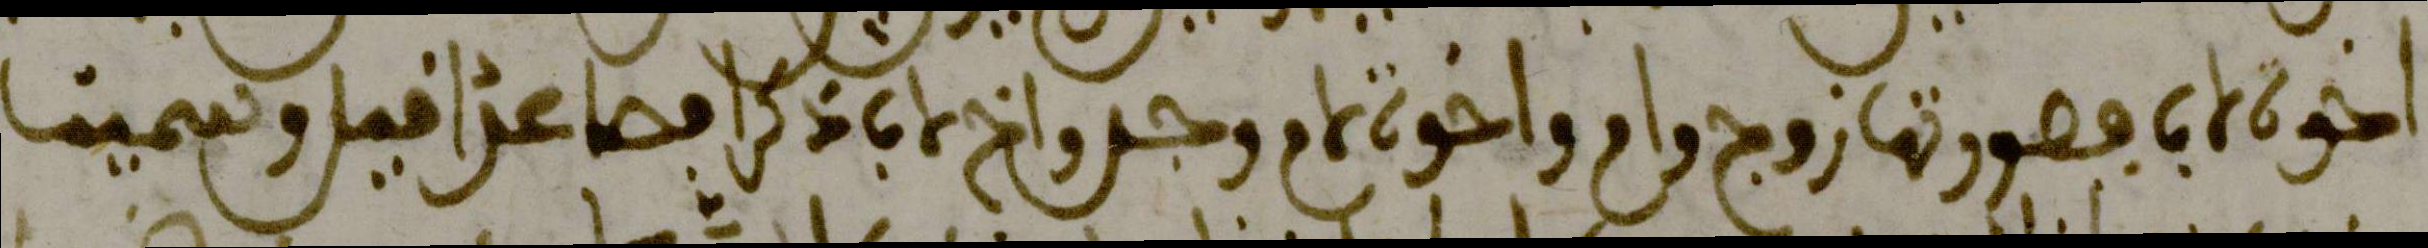اخوة لاب فصورتها زوج وام واخوة لام وجد واخ لاب ذكر فصاعدا قيل وسميت
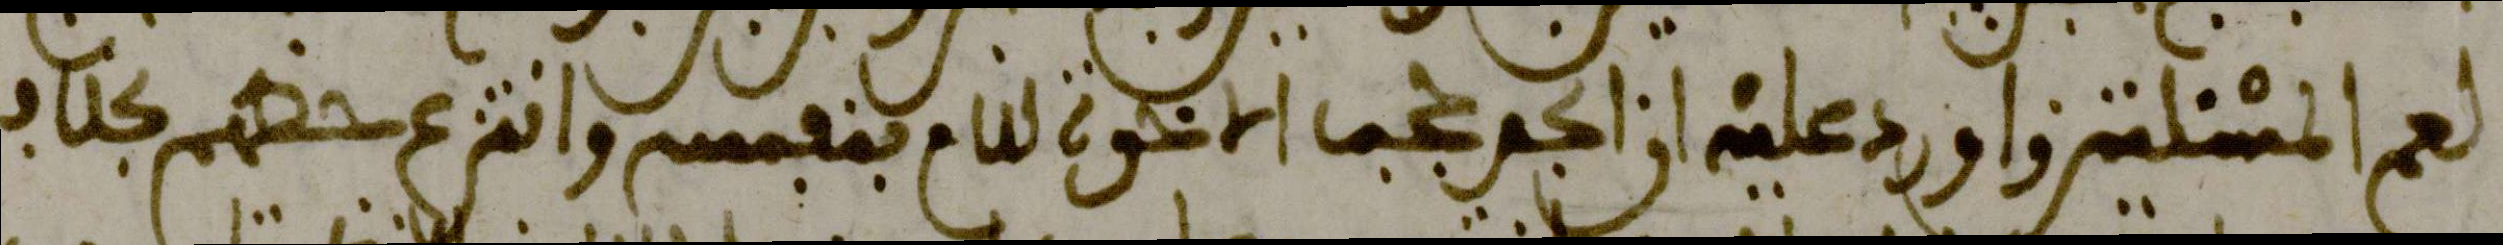لعم المسْئلتين واو رد عليْه ان الحد حجب الاخوة للام بنفسه وانتزع حظهم بخلاف
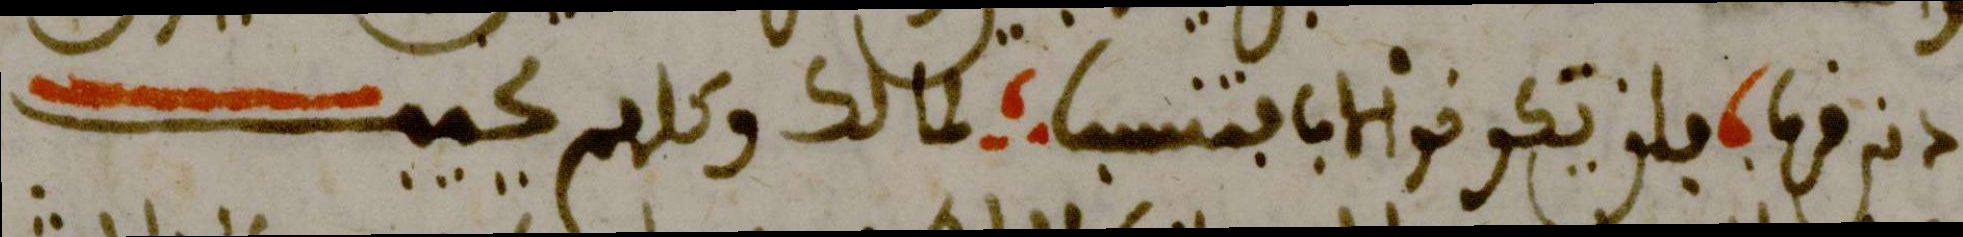دنى قرب فان يكو نوا لاب فتنسب لمالك وكلهم يخيب
